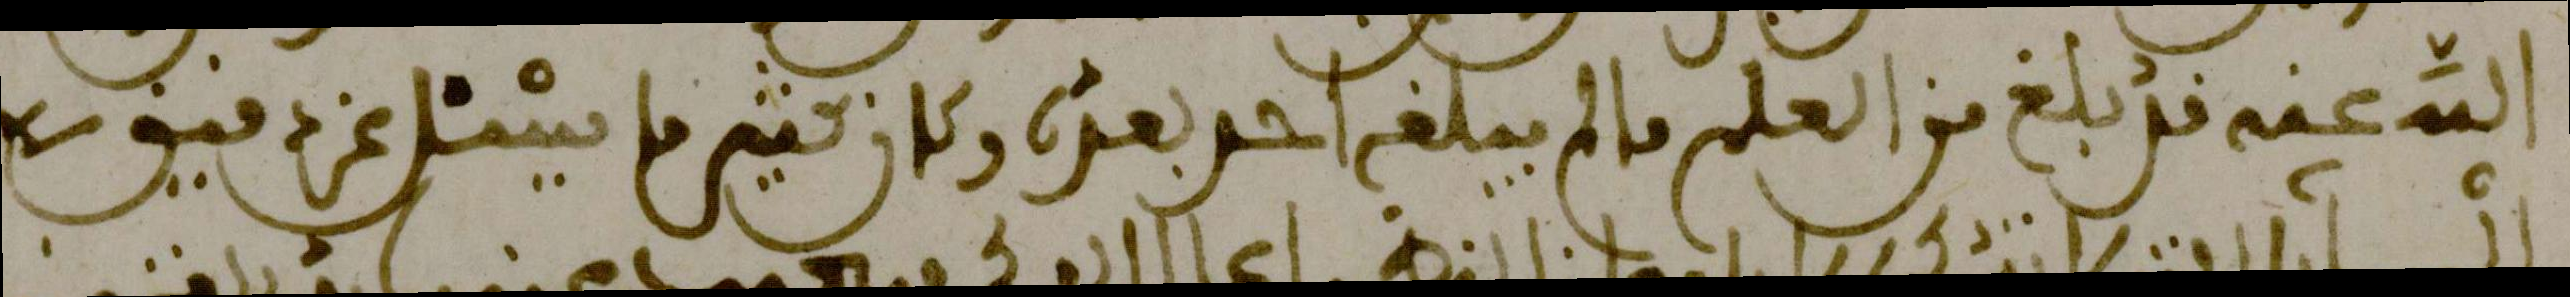الله عنه قد بلغ من العلم مالم يبلغه احد بعده وكان كثيرا يسئل عن دقيق
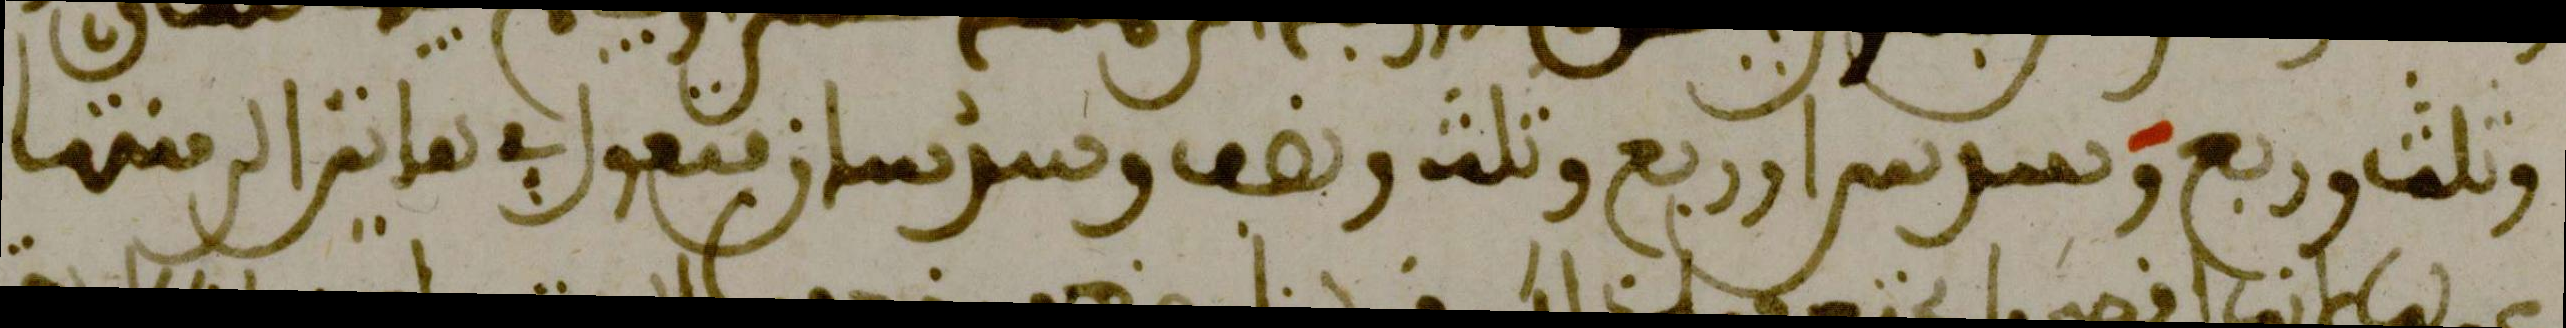وثلث وربع وسدس او ربع وثلث ونصف وسدسان فتعول في هاتين الي منها
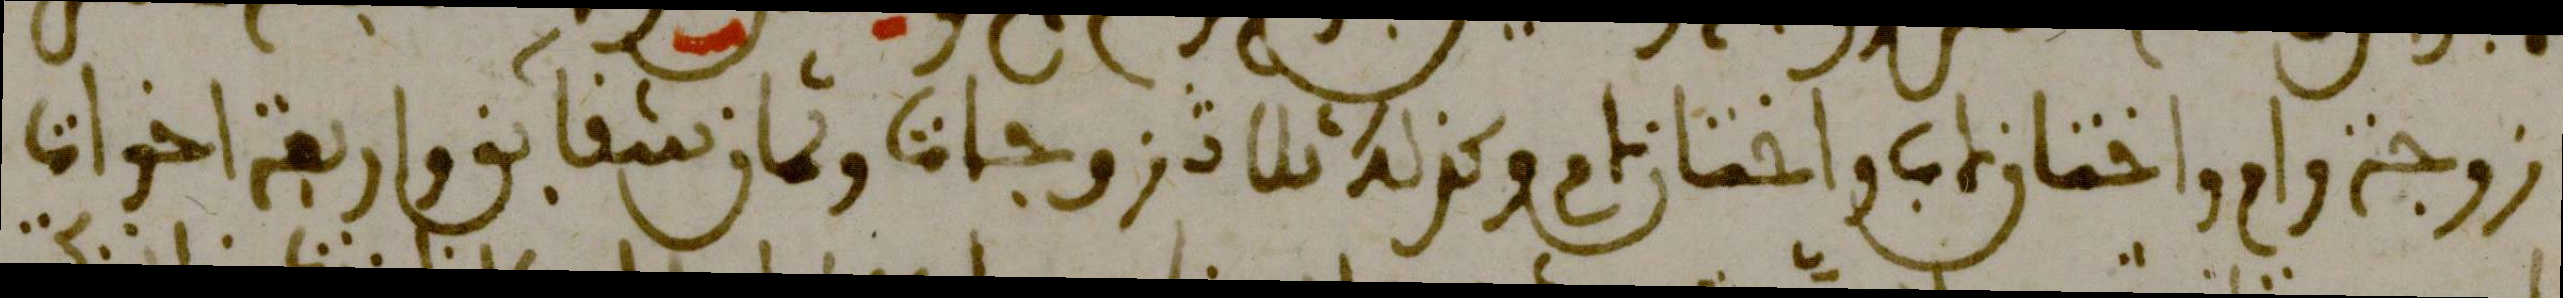زوجة وام اختان لاب واختان لام وكذلك ثلاث زوجات وثمان شقائق واربعة اخوات
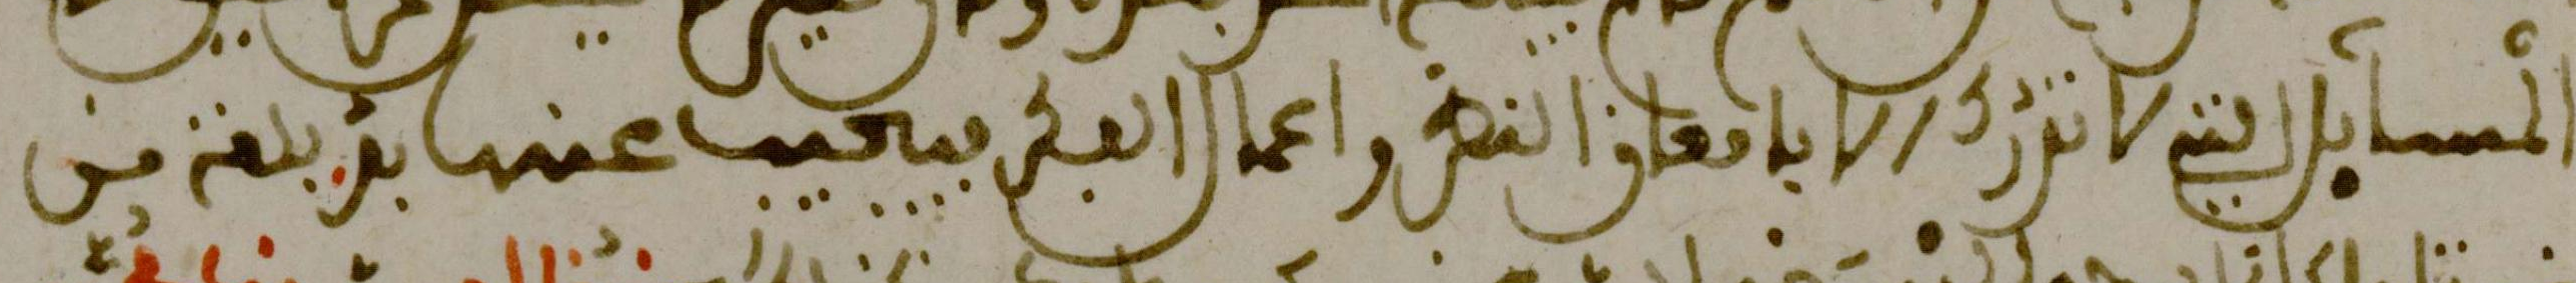المسائل االتي لا تدرك الا بامعان النظر واعمال الفكر فيجيب عنها بديهة من
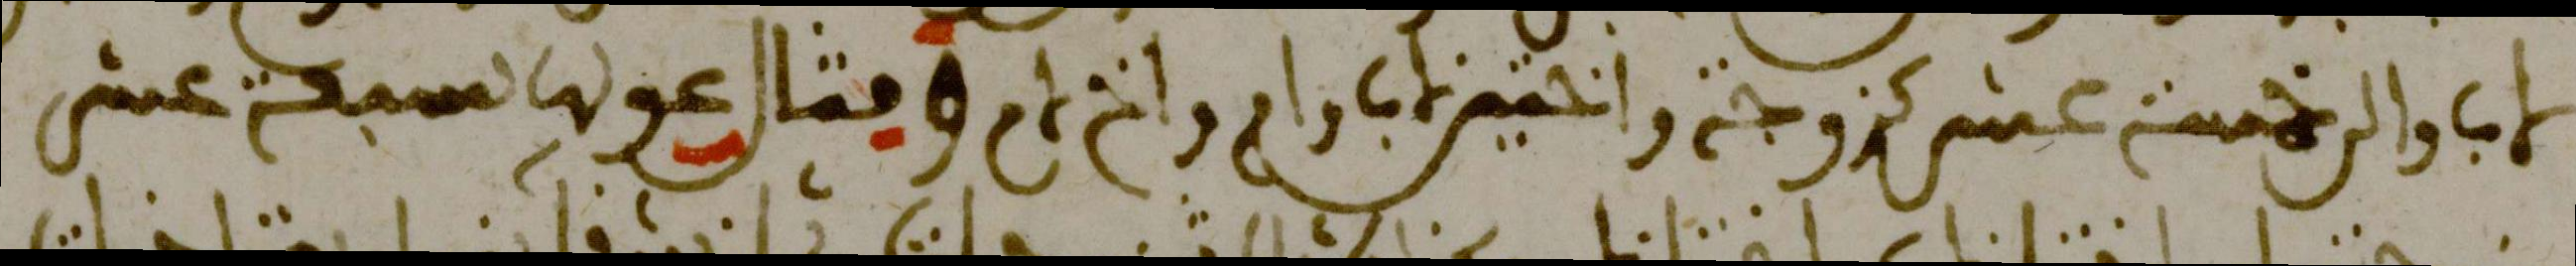لاب والى خمسة عشر كزوجة واختين لاب وام واخ لام ومثال عولها سبعة عشر
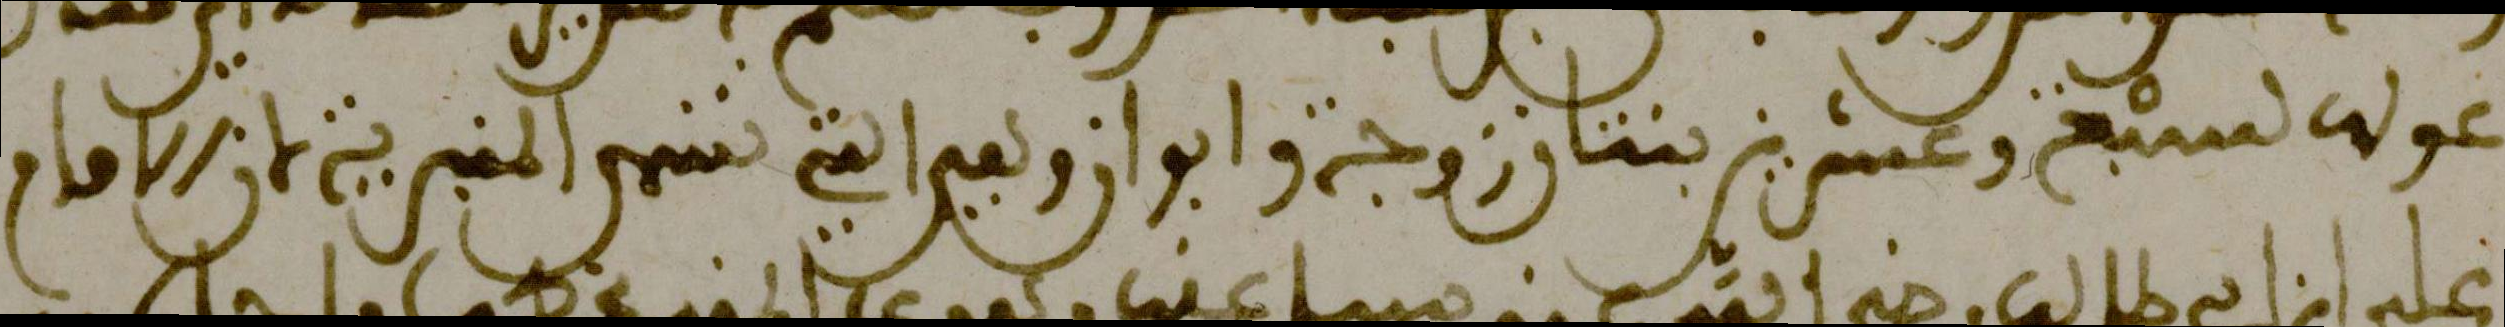عولها لسبعة وعشرين بنتان زوجة ابوان هي التي تسمى المنبرية لان الامام
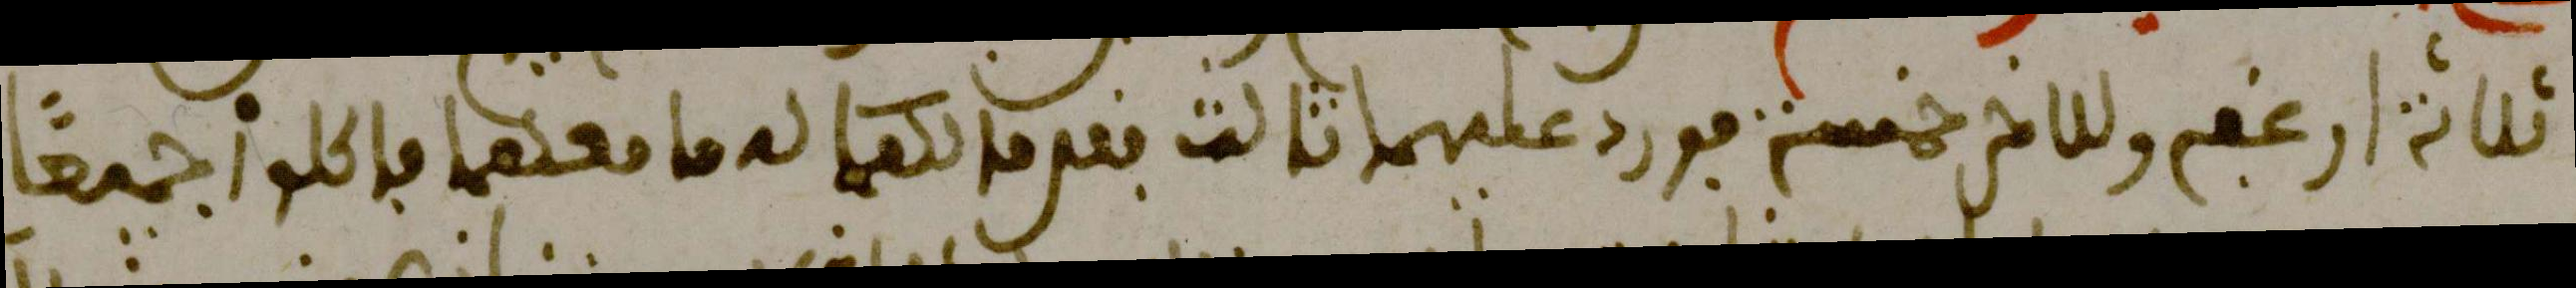ثلاثة ارغفه وللاخر خمسة فورد عليهما ثالث فقدما لها له ما معهما فاكلو أجميعا
